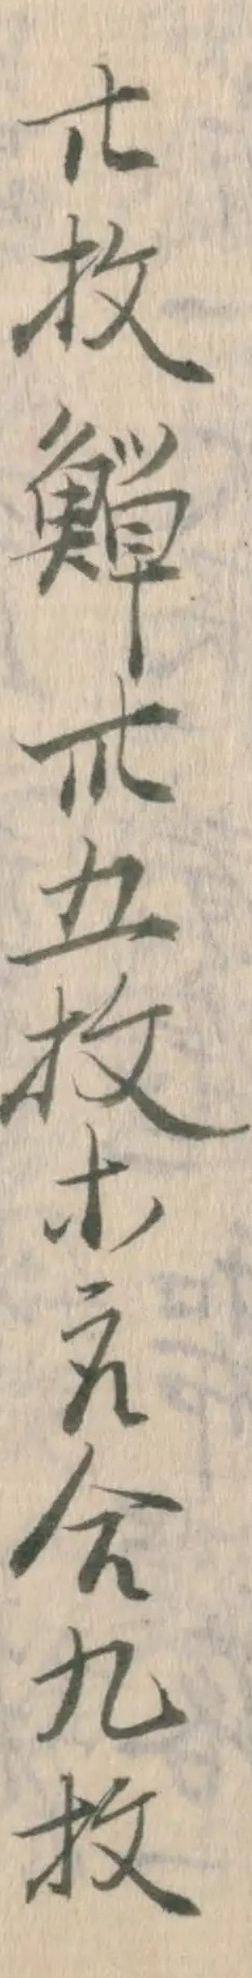廿枚鱓卅五枚等取合九枚
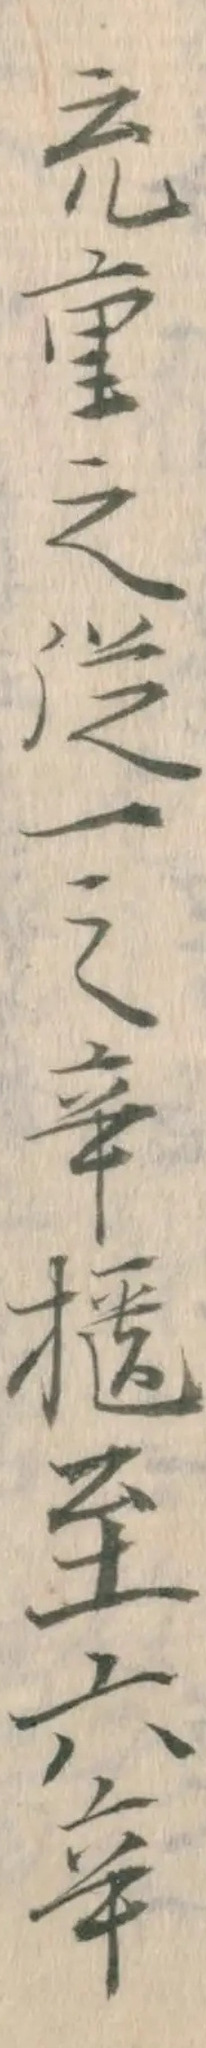充重之従一之辛櫃至六辛
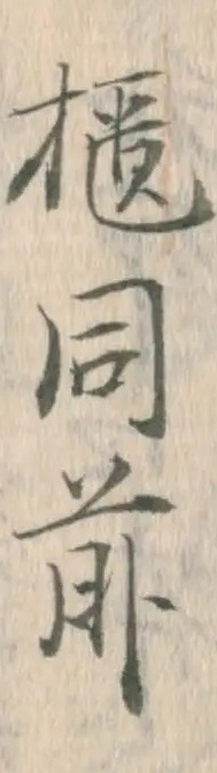櫃同前

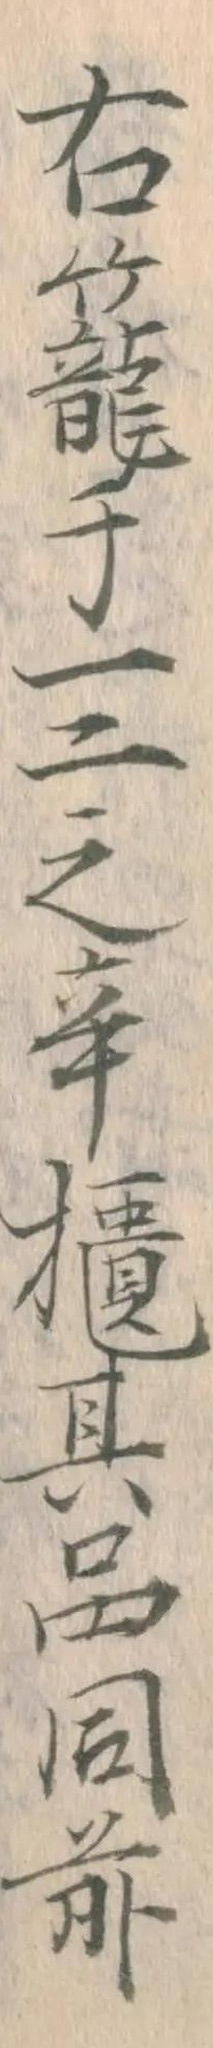右籠于一二之辛櫃其品同前
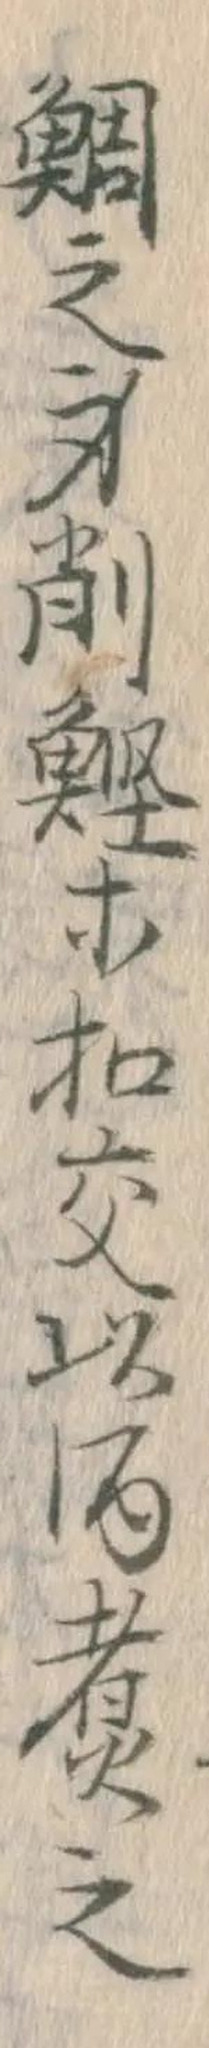鯛之身削鰹等扣交以酒煮之

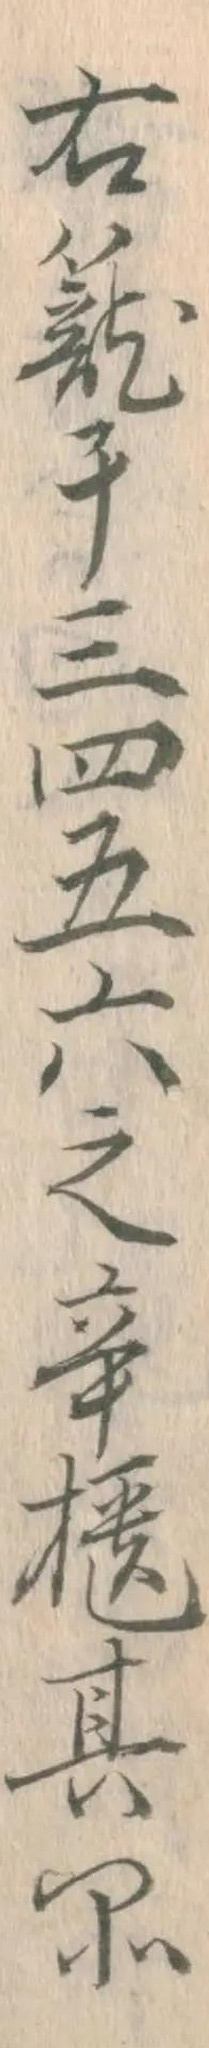右籠于三四五六之辛櫃其品
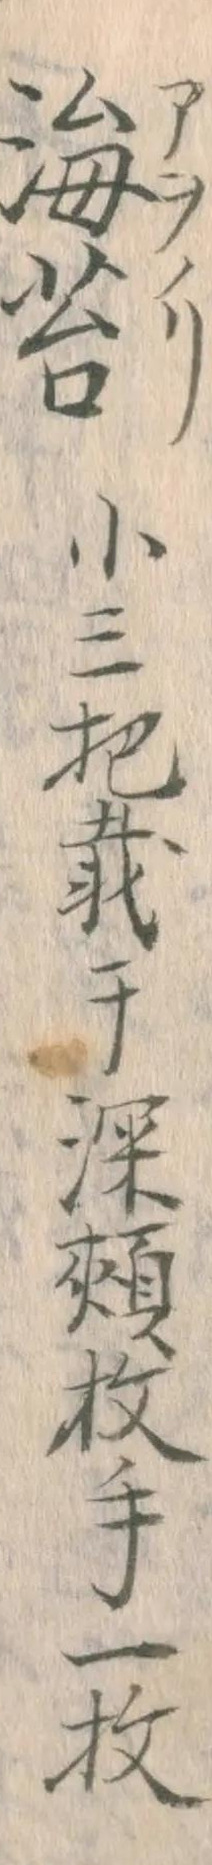一海苔小三把載于深頬枚手一枚
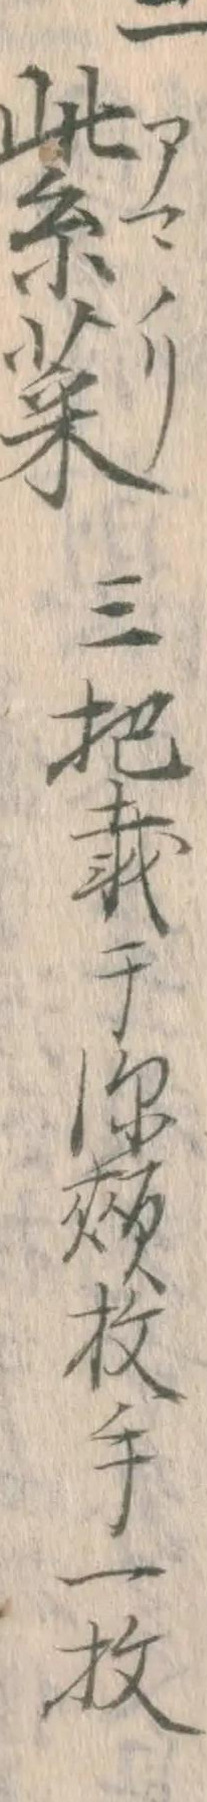三柴菜三把載于深頬枚手一枚
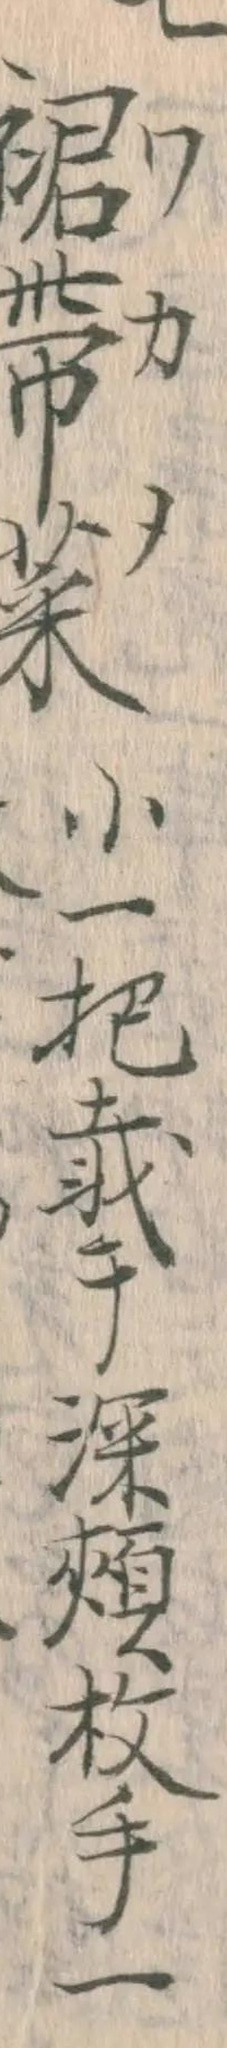三柴菜三把載于深頬枚手一枚
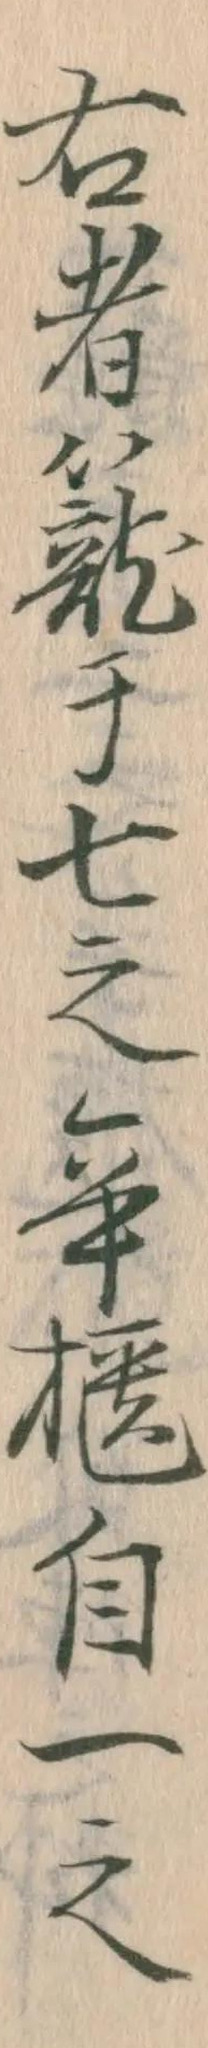右者籠于七之辛櫃自一之
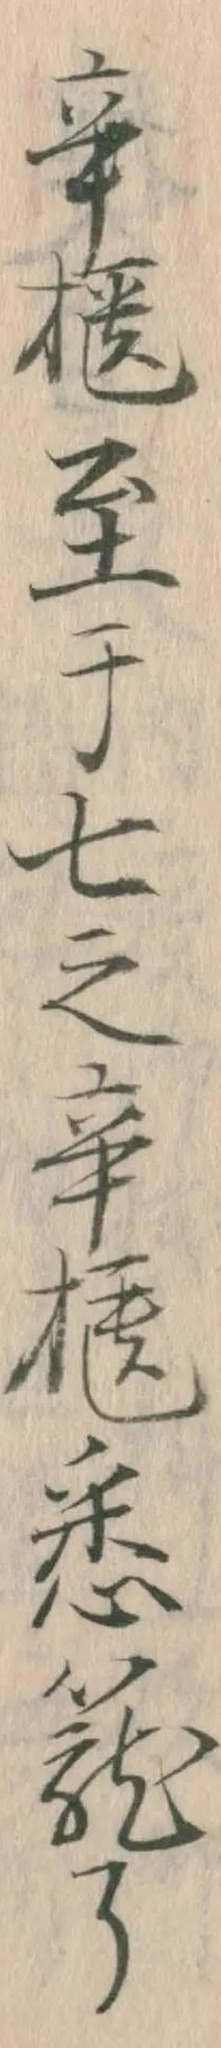辛櫃至于七之辛櫃悉籠了
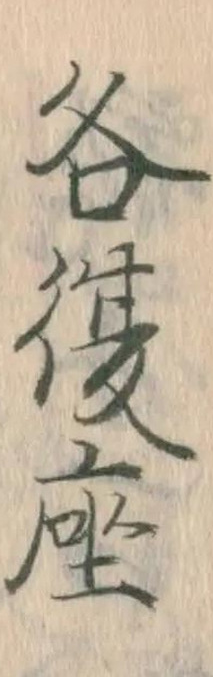各複座
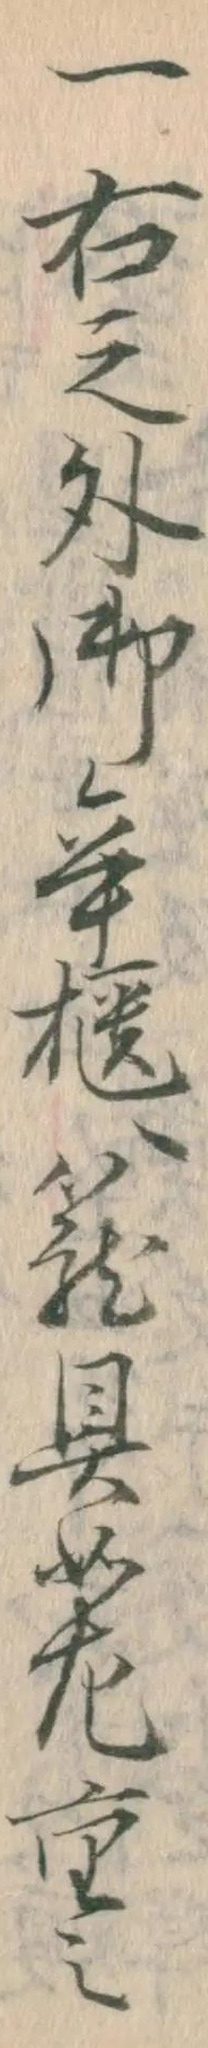一右之外御辛櫃へ籠具如左重之
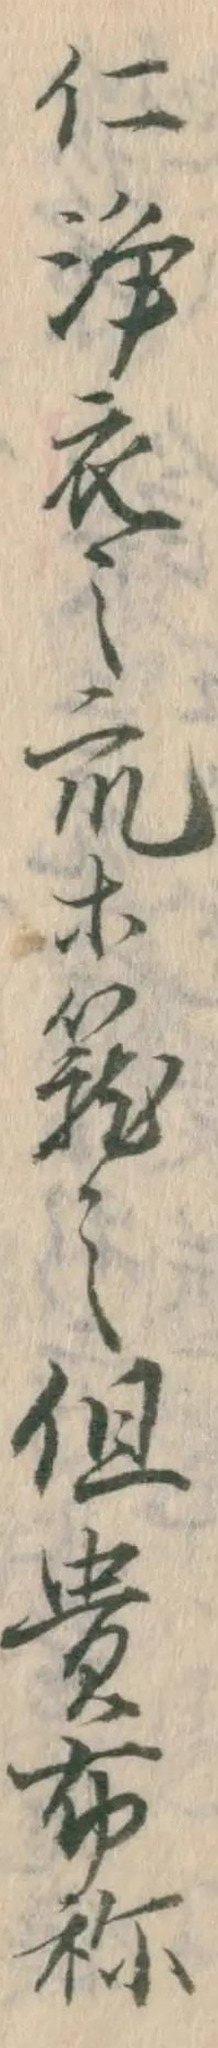仁浄衣之衆等籠之但貴布祢
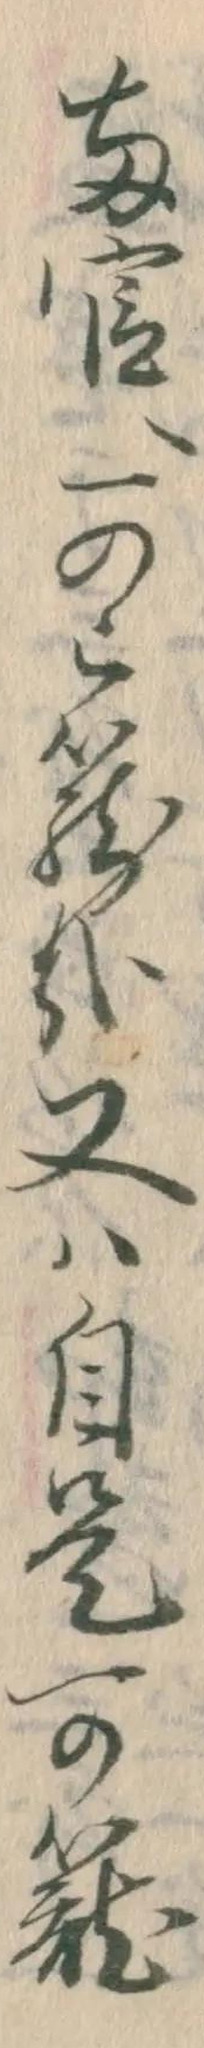両官へ可被籠哉又は自是可籠
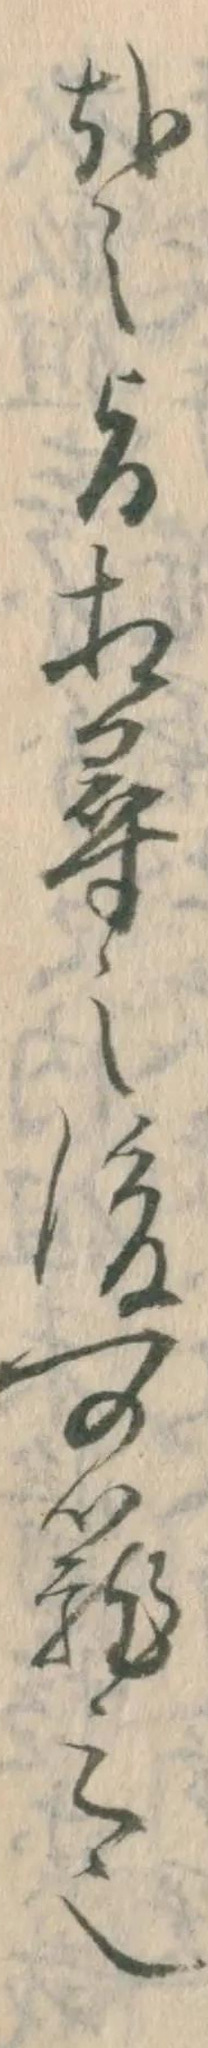哉之旨相尋之後可籠也
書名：賀茂社記録. 第81冊
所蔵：国立国会図書館 National Diet Library, JAPAN
